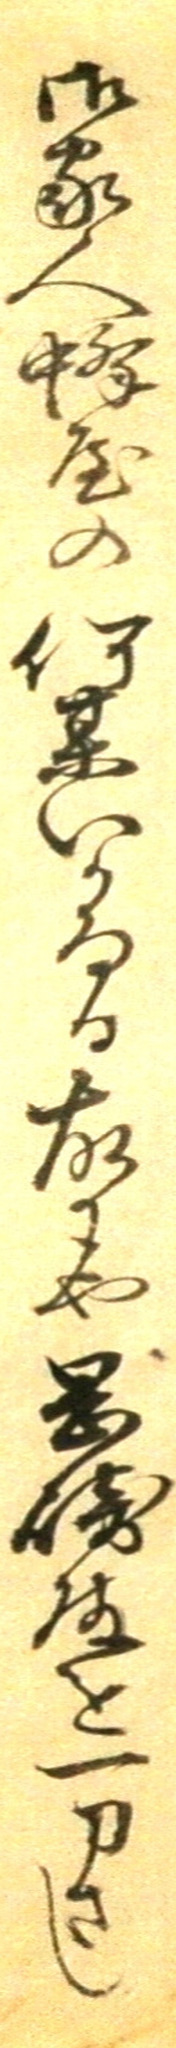御家人蜂屋の何某いかなる故にや岡崎殿を一刀さし
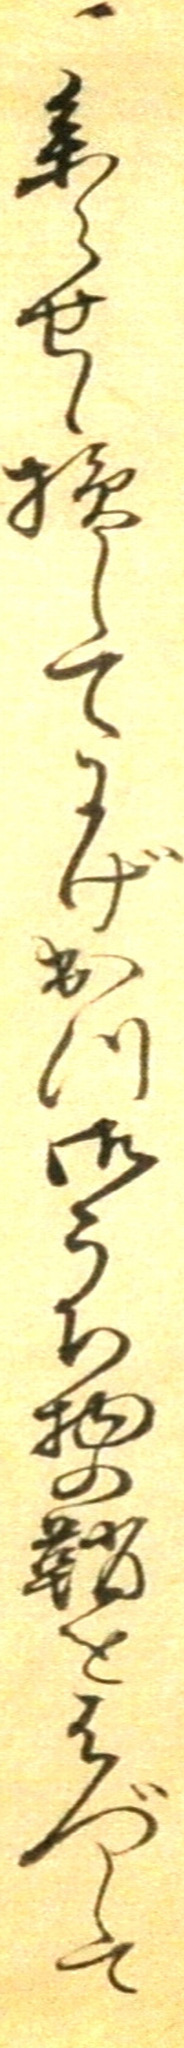参らせし損してにげおつ御うち物の鞘をはづして
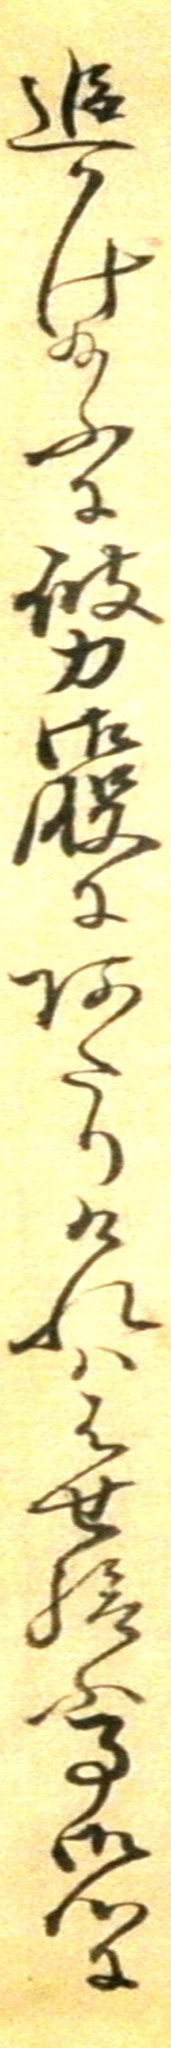追かけ給ふに彼力御股にあたりけれははせ給ふ事御心に
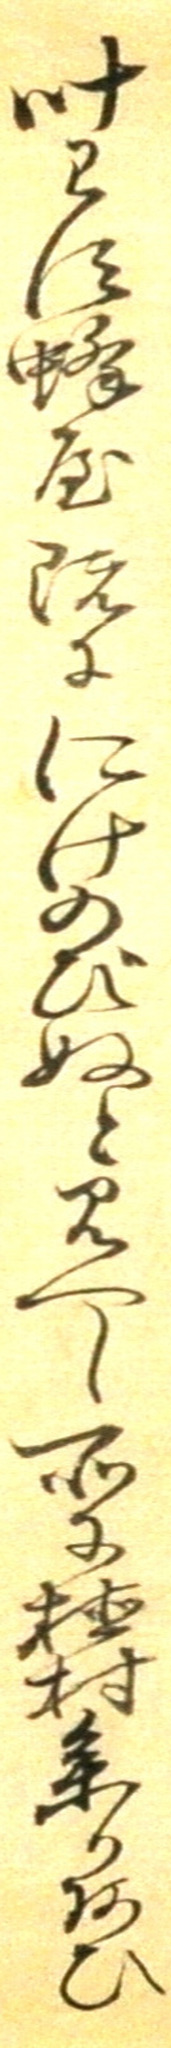叶わす蜂屋既ににけのびぬと見へし所に植村参りあひ
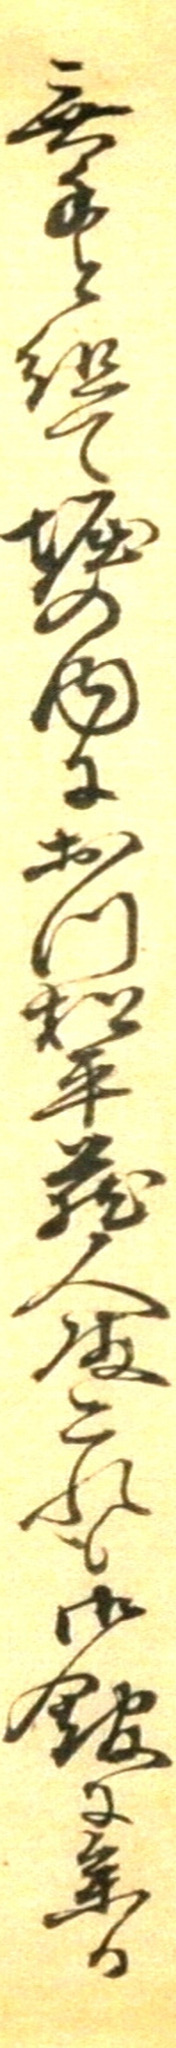無手と組て堀の内におつ松平蔵人殿これも御舘に参る
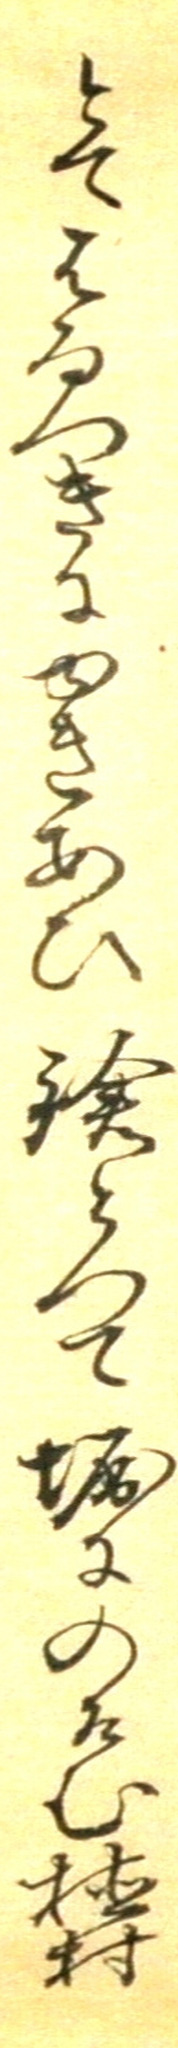とてはなつきにゆきあひ鎗とつて堀にのそむ植村
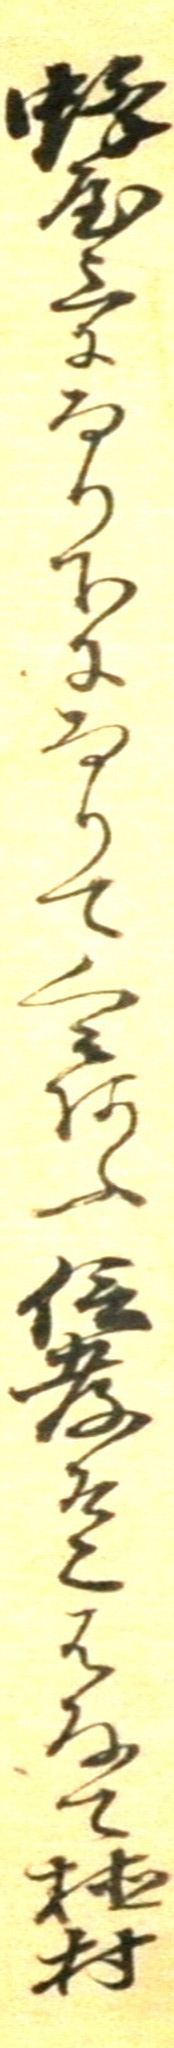蜂屋上になり下になりてくみあふ信孝そこはなて植村
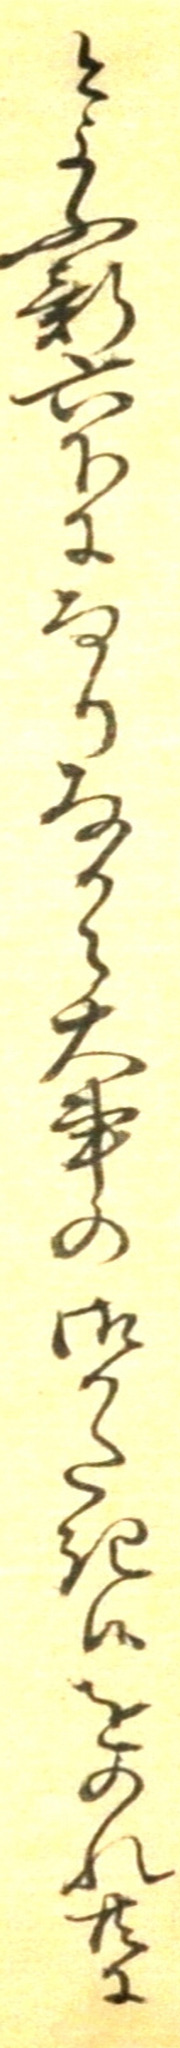とよふ新六下になりなから大事の御かたき候をのれ共に
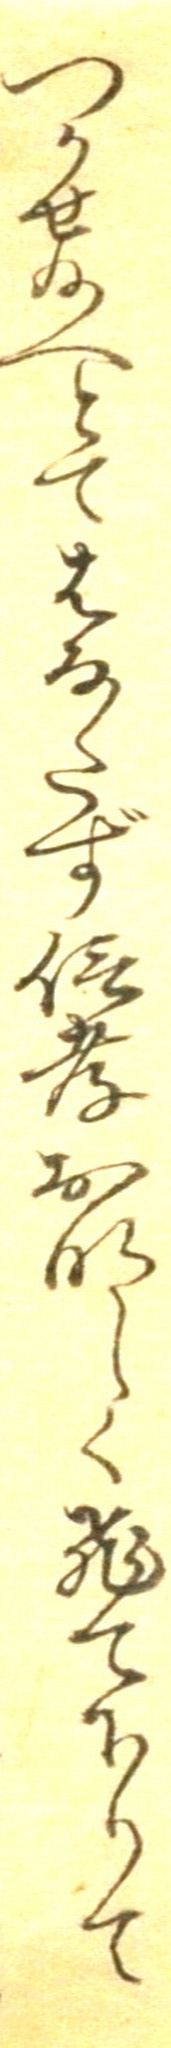つかせ給へとてはなたず信孝おなしく飛て下りて

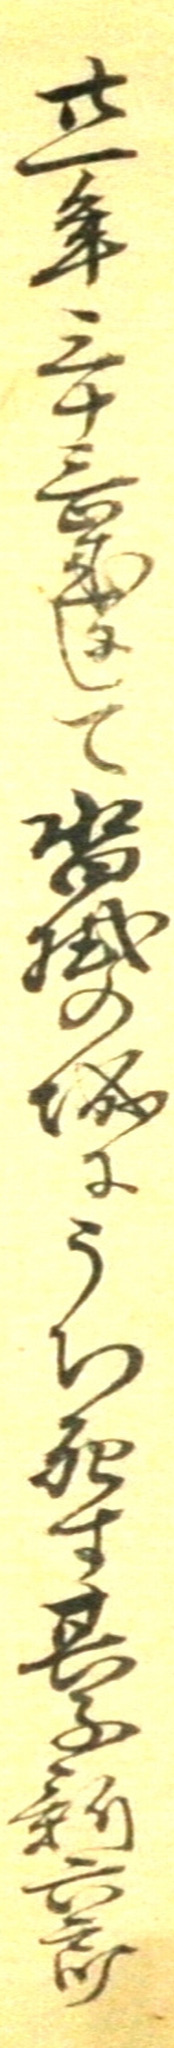廿一年三十三歳にして沓掛の城にうち死す其子新六郎
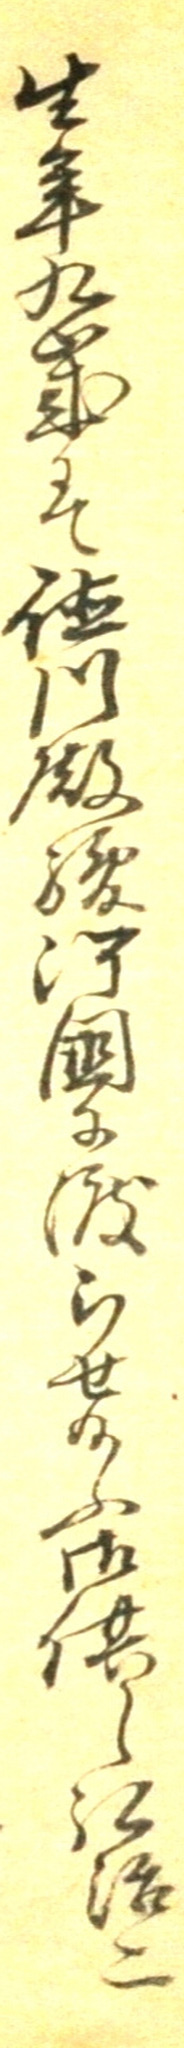生年九歳にて徳川殿駿河国に渡らせ給ふ御供し弘治二
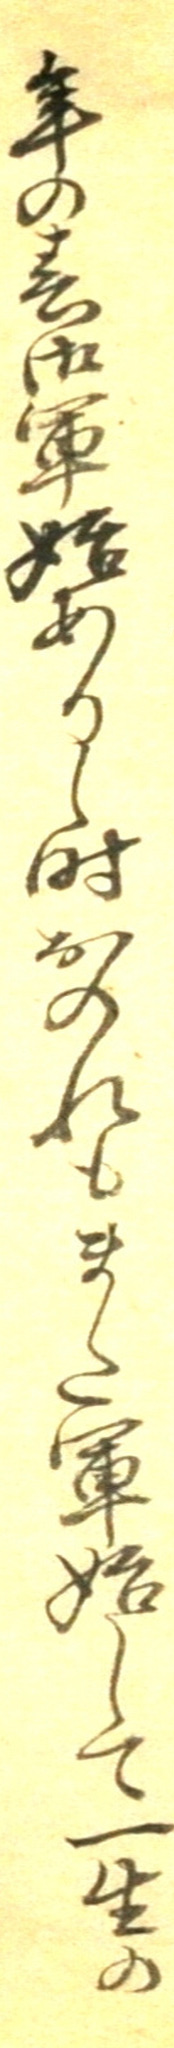年の春御軍始ありし時おのれもまた軍始して一生の
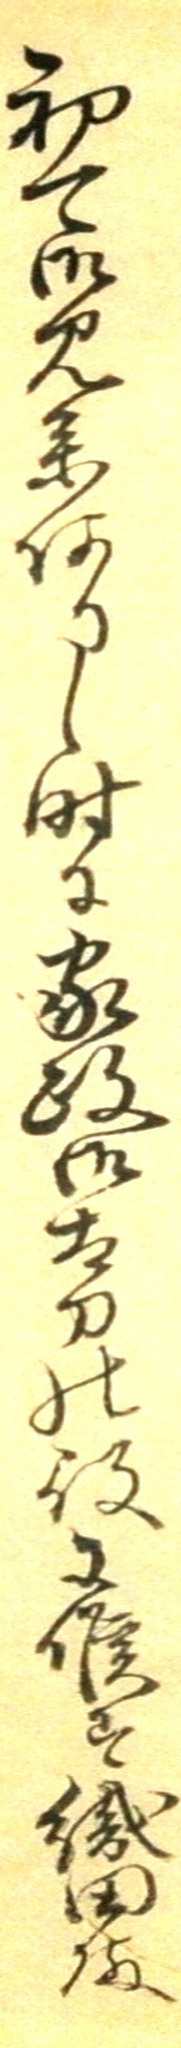初て御見参ありし時に家政御太刀の役に候す織田殿
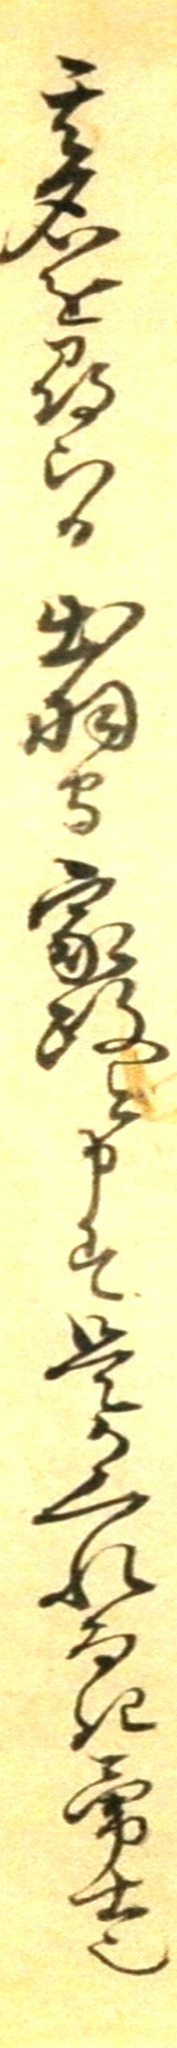其名を尋らる出羽守家政と申す是かくれなき勇士也
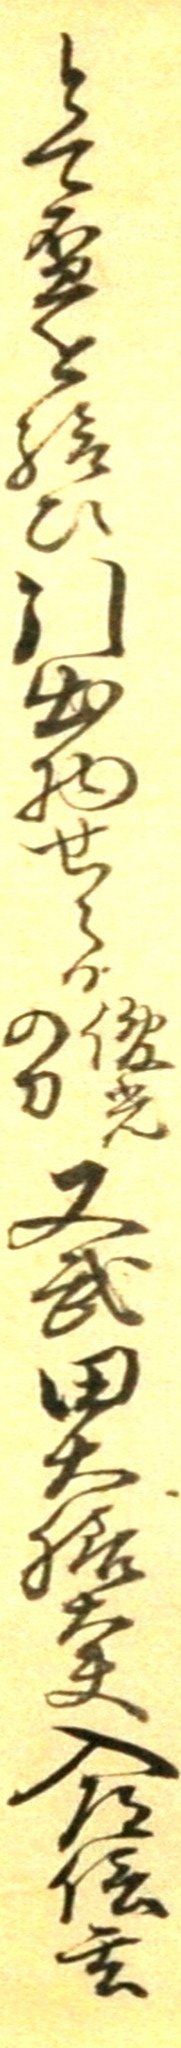とて盃を給ひ引出物せらる俊光の刀又武田大膳大夫入道信玄
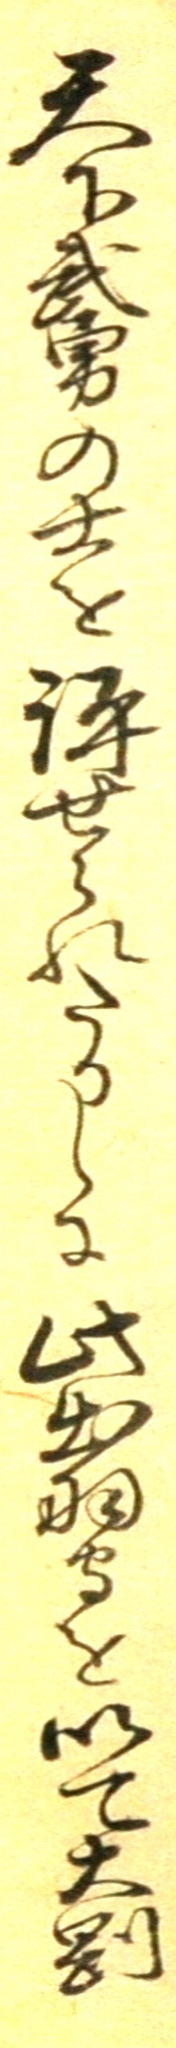天下武勇の士を評せられたりしに此出羽守を以て大剛
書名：藩翰譜（四・中）
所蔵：伊那市立高遠町図書館・合同会社AMANE
